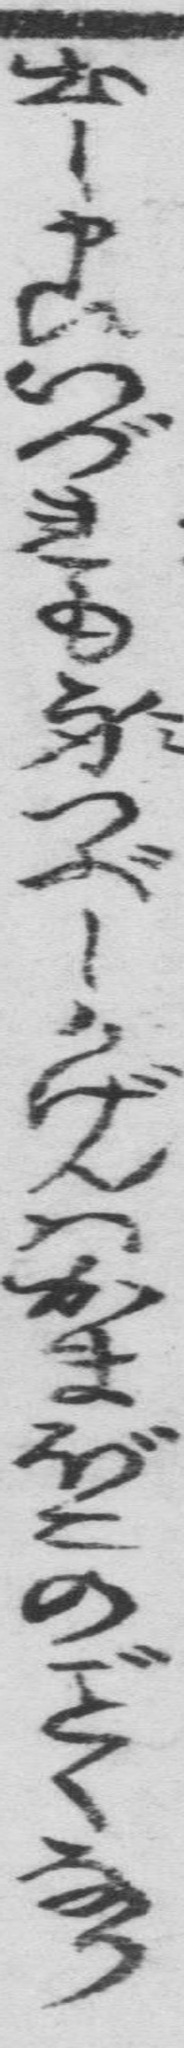出しいづれも身つぶしかげんハかまぼこのごとくなり
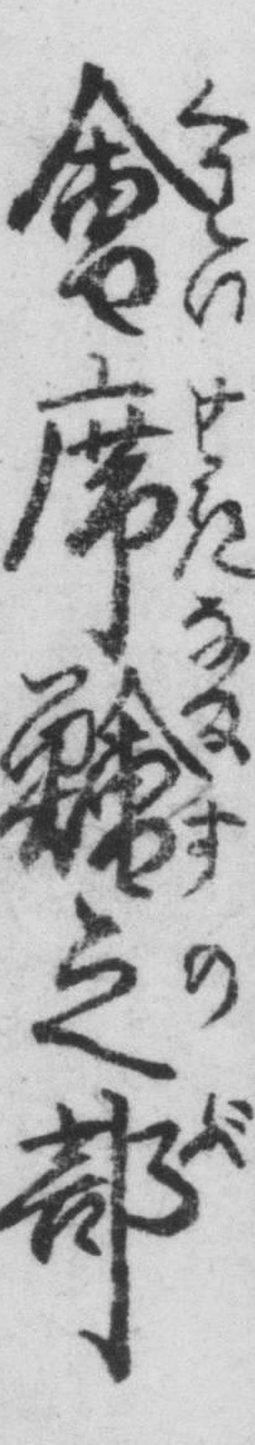會席鱠之部
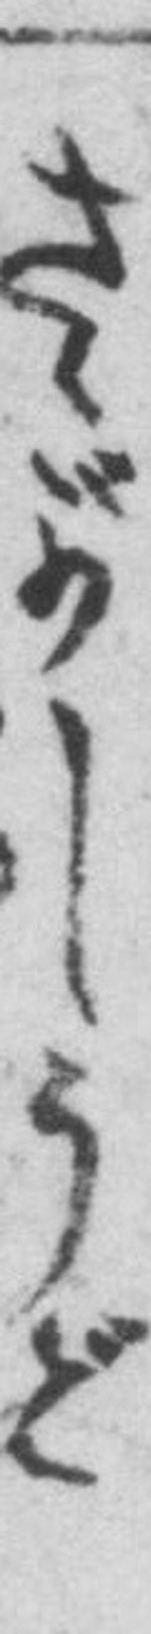さゝしうど
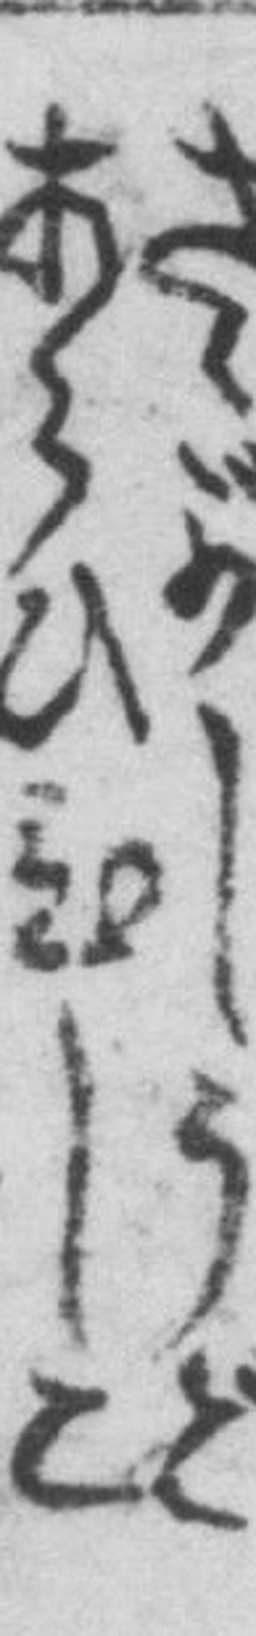あらひへしこ
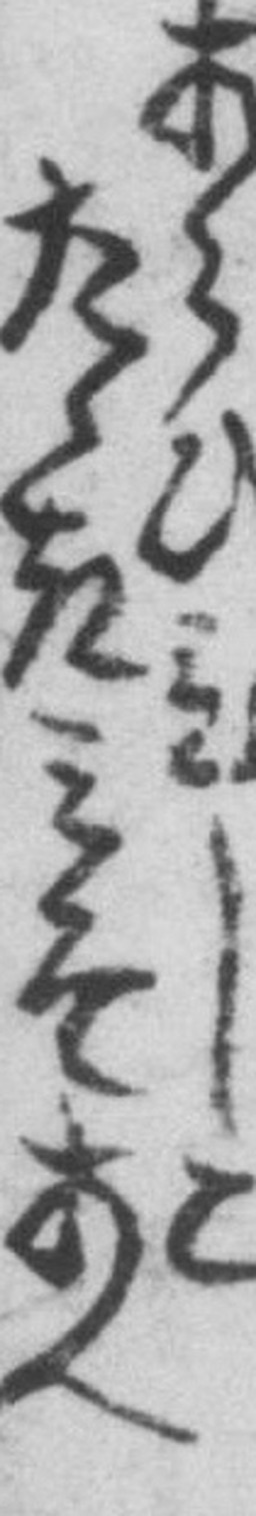たゝきミそあへ
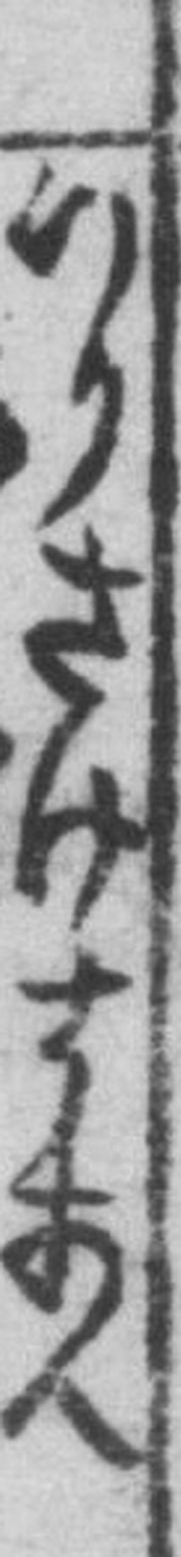いりさけすあへ

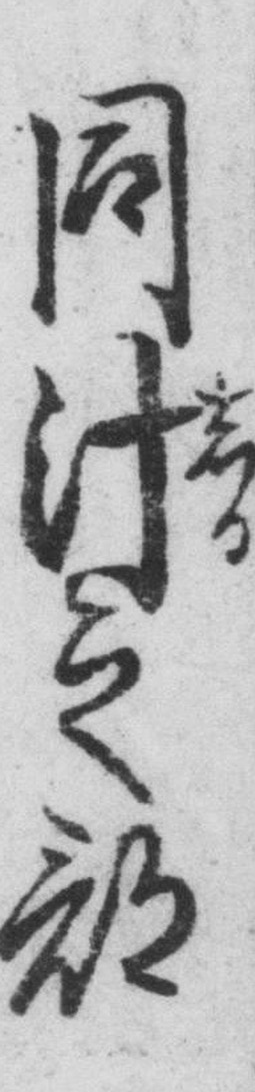同汁之部
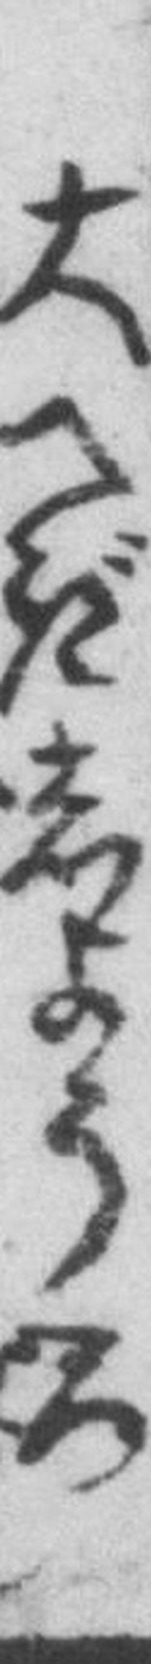大へぎしやうろ
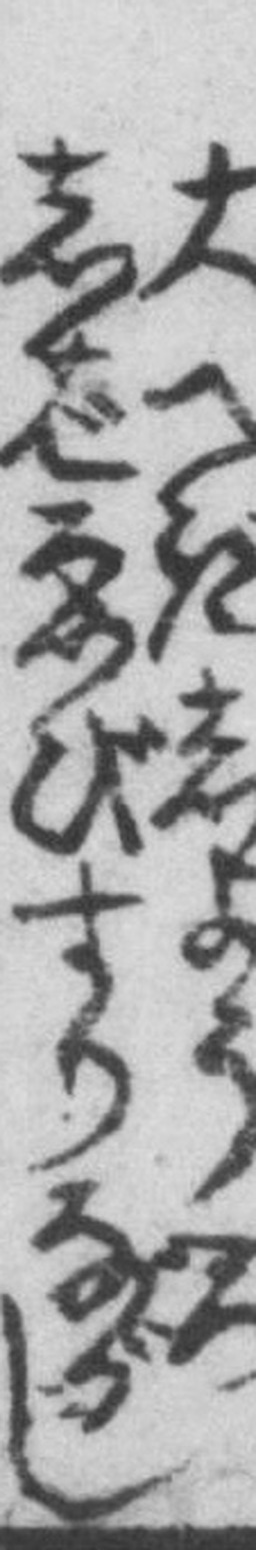しばゑびすりながし
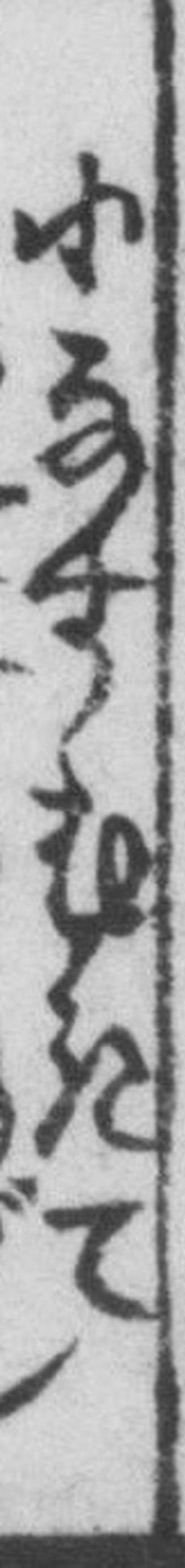小なすむきて
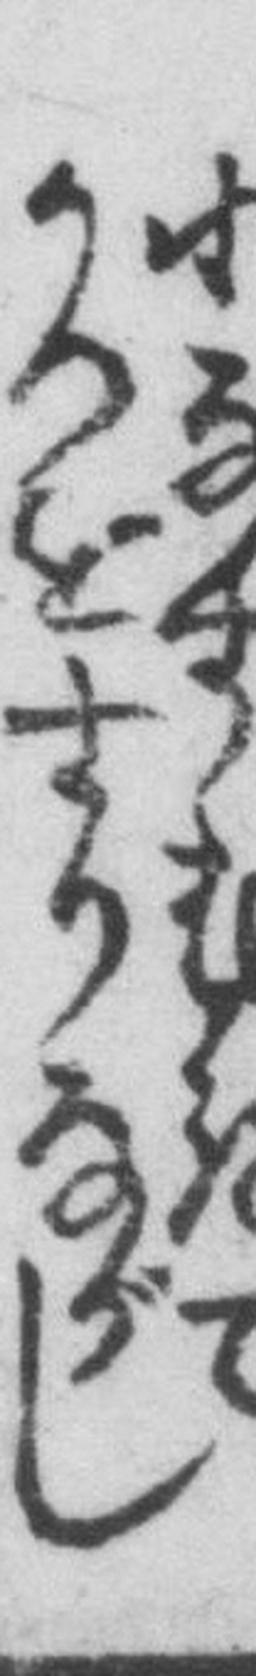かつをすりながし
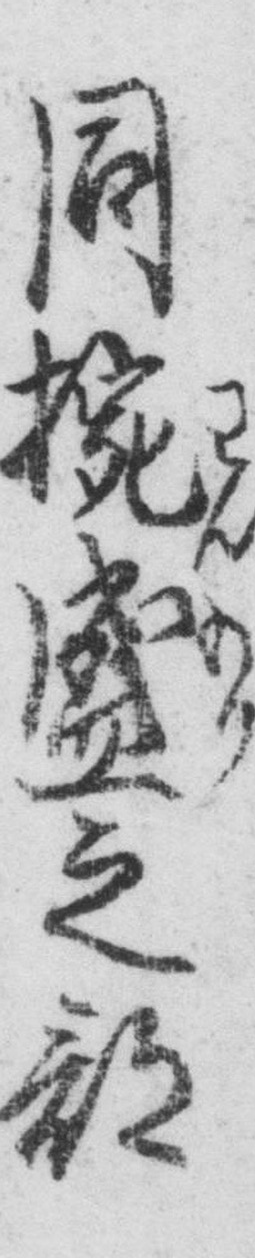同椀盛之部
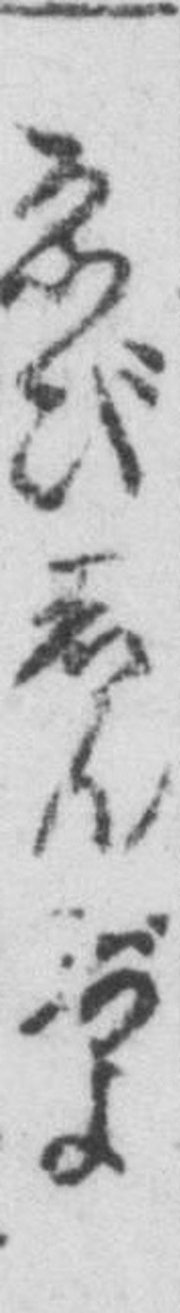ゑびしんじよ
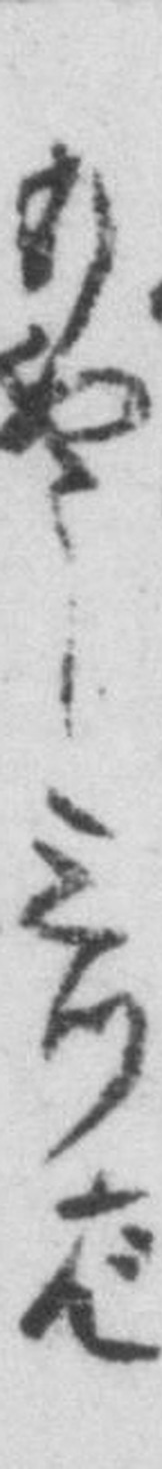もやしミつば
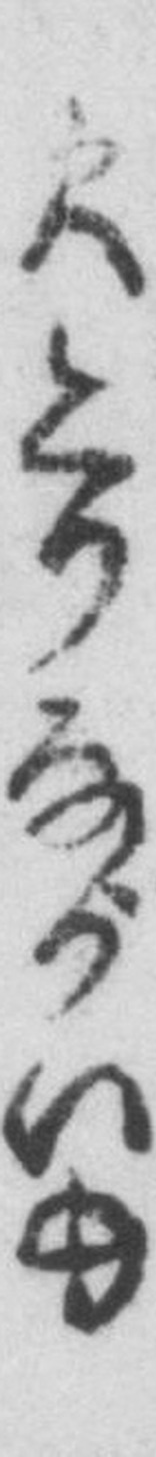火とりながいも
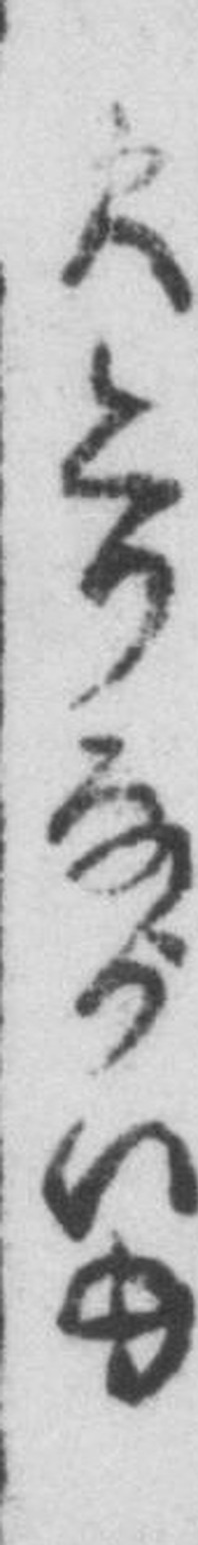火とりながいも
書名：即席庖丁
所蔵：大阪府立大学学術情報センター 国文学研究資料館
